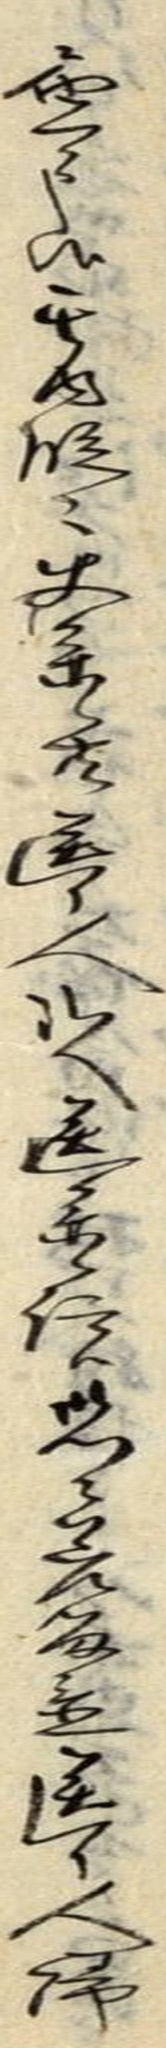届可申候其内段々使参候共送り人弐人送参候得は御門に差留置送り人帰
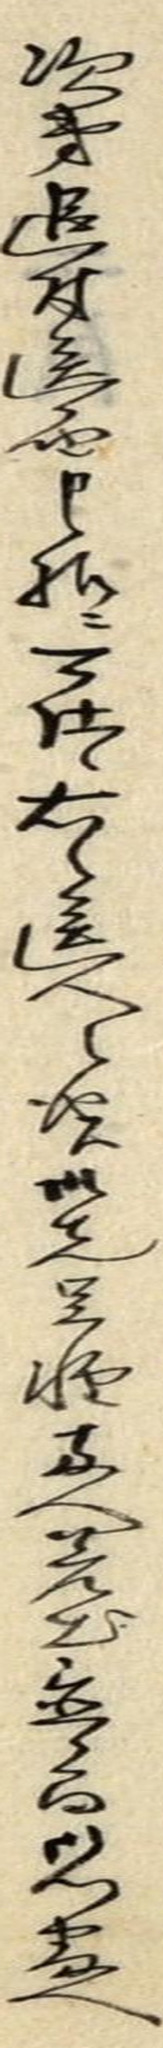次第追付送届申候様に可仕候右之送人之儀は御先足軽両人差出置候間御門番人
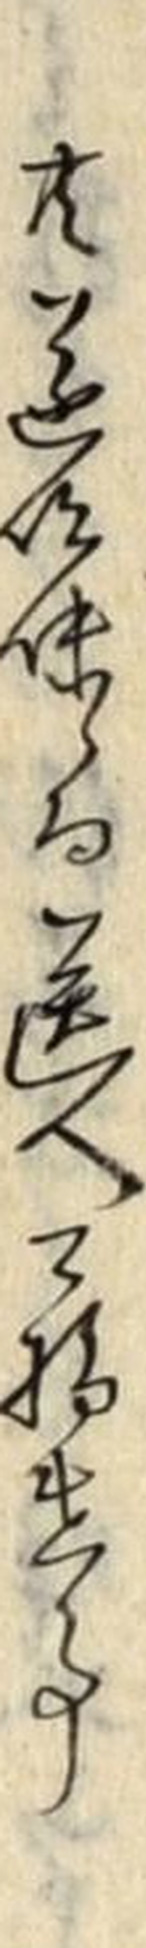共遂吟味候て送人可指遣事
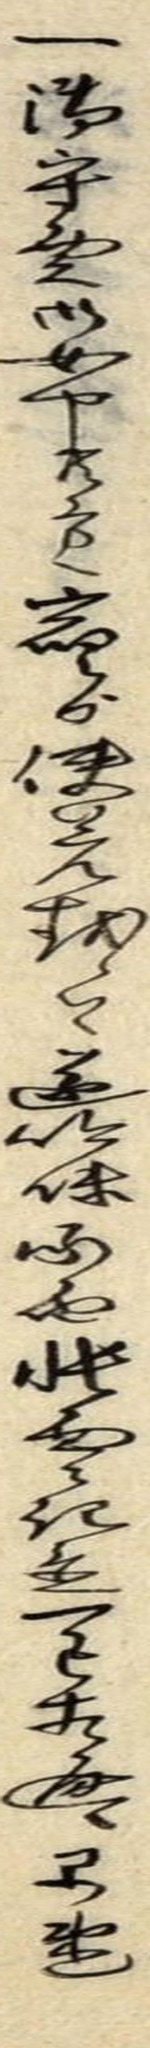一御守殿御女中共方へ宿々ゟ使差越候はゝ遂吟味承届帳面に記置可被相通候早速
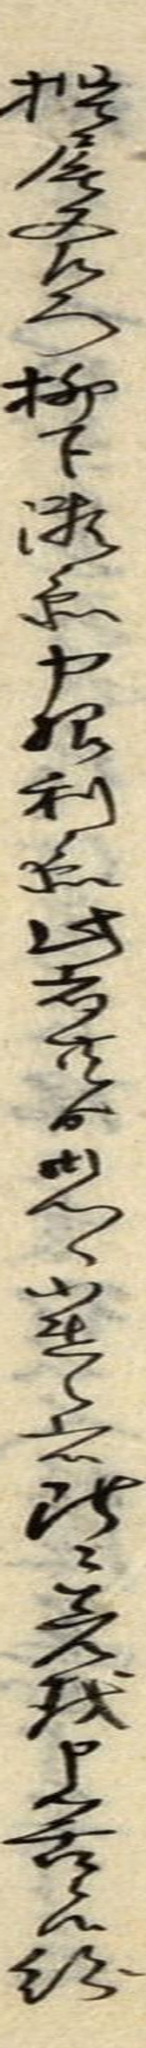樫尾又左衛門柳下瀬兵衛中根利兵衛此者共ゟ御門へ小遣之者断に差越申筈に候紛
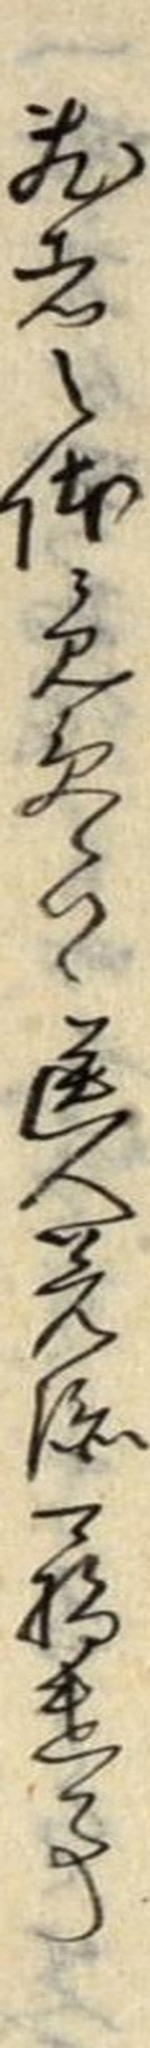敷者之体に見受候はゝ送人差添可指遣事

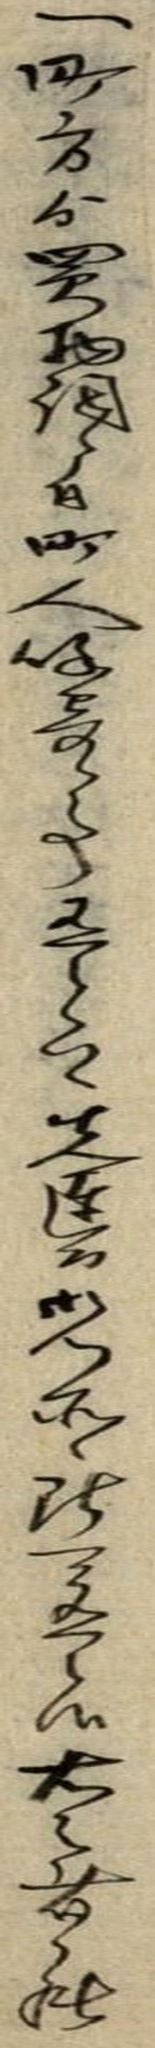一町方ゟ買物調候付町人呼寄候事有之候はゝ先達て御門所へ断可有之候右之者罷
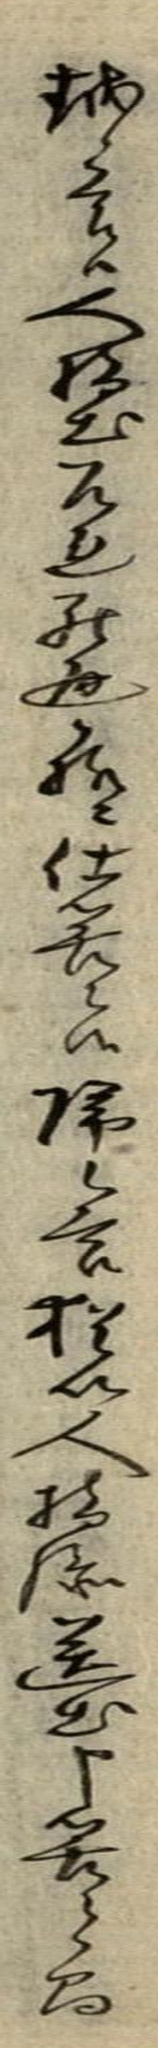越候節は人指出召連罷通候様に仕候筈に候帰候節猶以人指添送出申筈に候間
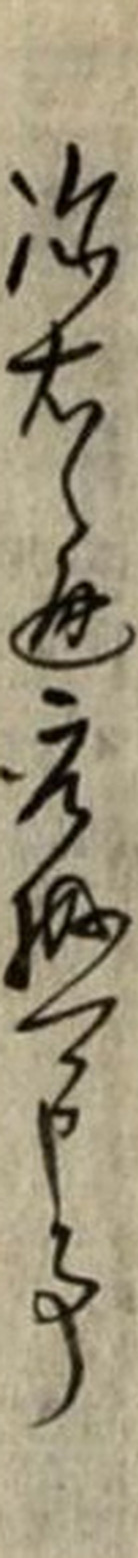弥右之通取扱可申事
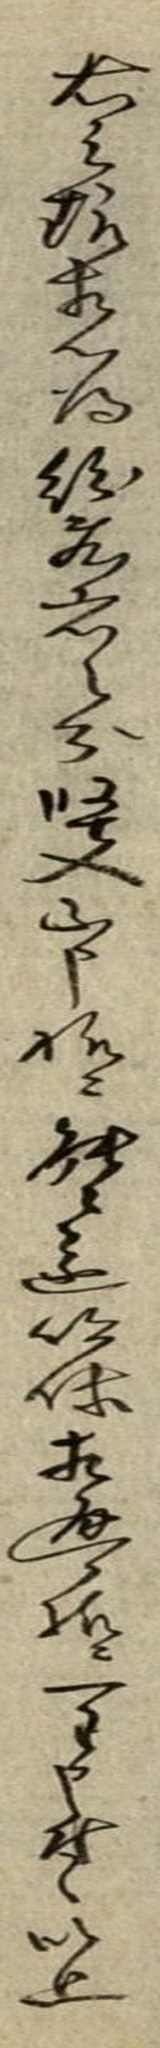右之趣相心得紛敷者之分堅入不申様に能々遂吟味相通候様に可被申付候以上
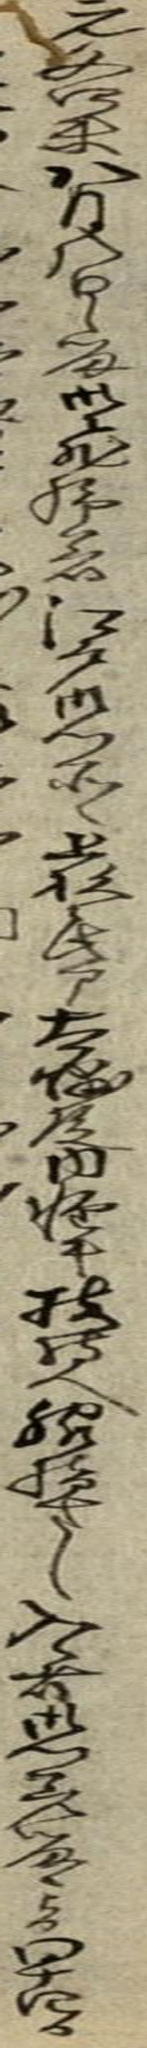一元文四未八月八日之留御飛脚着江戸御門所之上杉民部太輔殿内軽き扶持人脇指さし入候者御門差留候旨同十四日
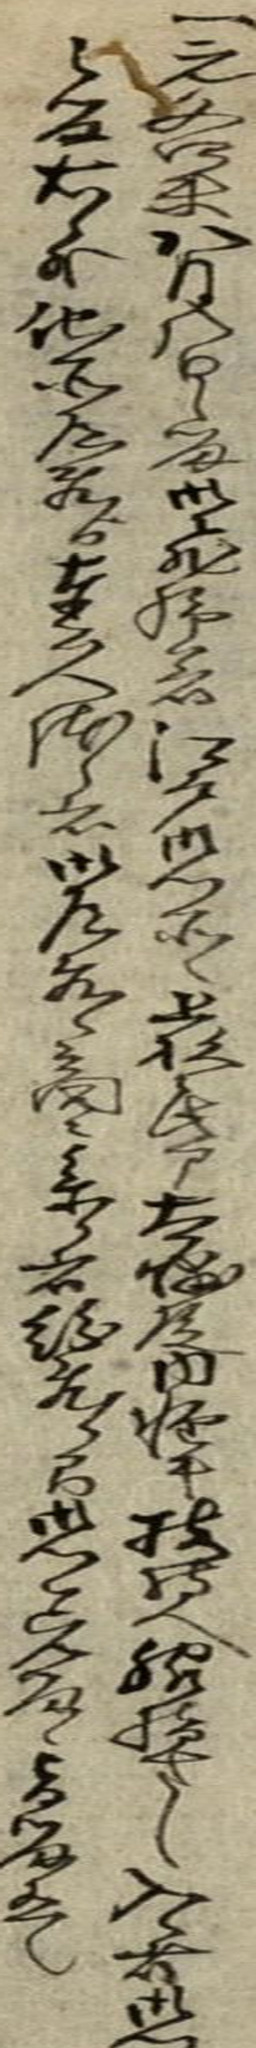之留右之外他所屋敷ゟ奉公人体之者御屋敷へ商に参候者紛敷候間御門差留候旨留有之

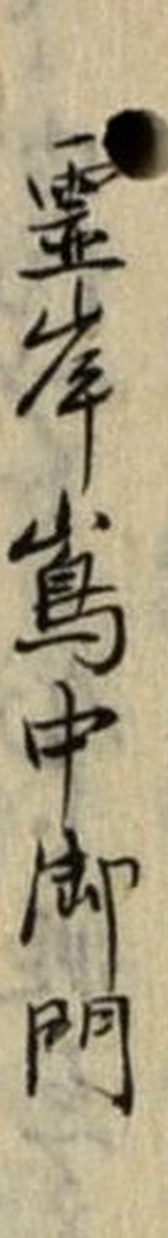霊岸島中御門
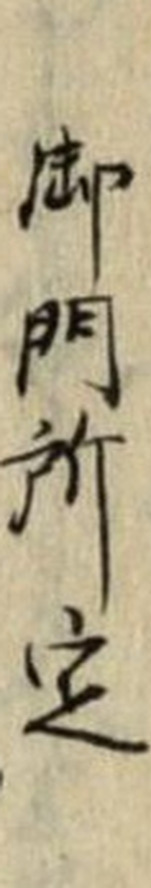御門所定
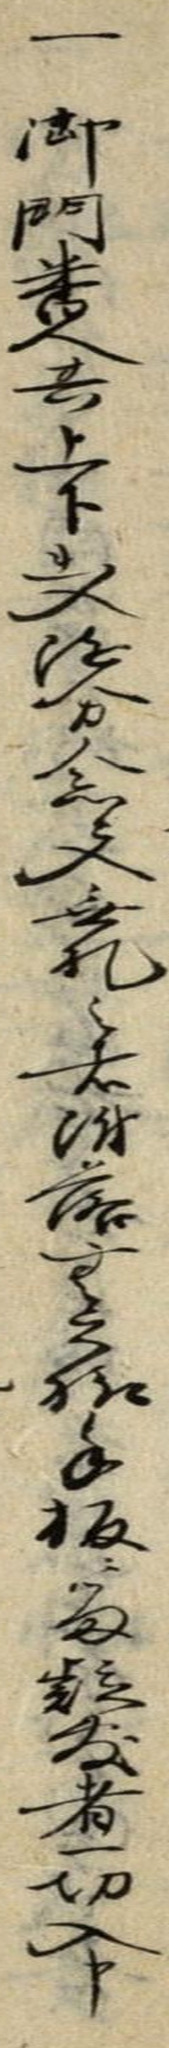一御門番人共上下出入随分念被入無札之者附落無之様手板に留疑敷者一切入申
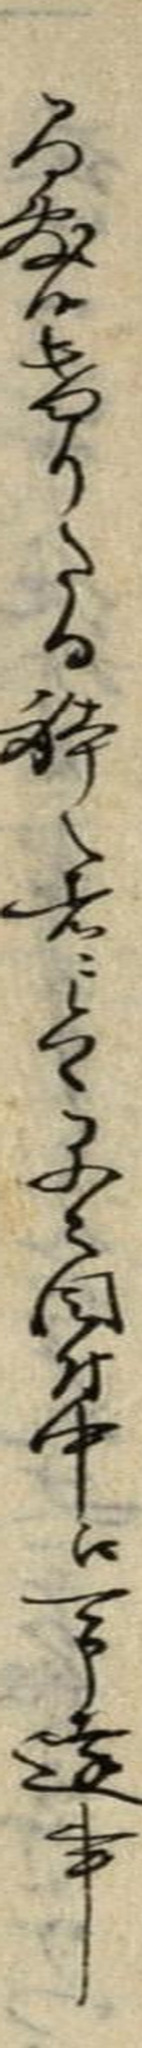間敷候替りたる体之者に候はゝ早々目付中江可申達事
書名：三都并道中之部
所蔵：福井県文書館 Fukui Prefectural Archives
